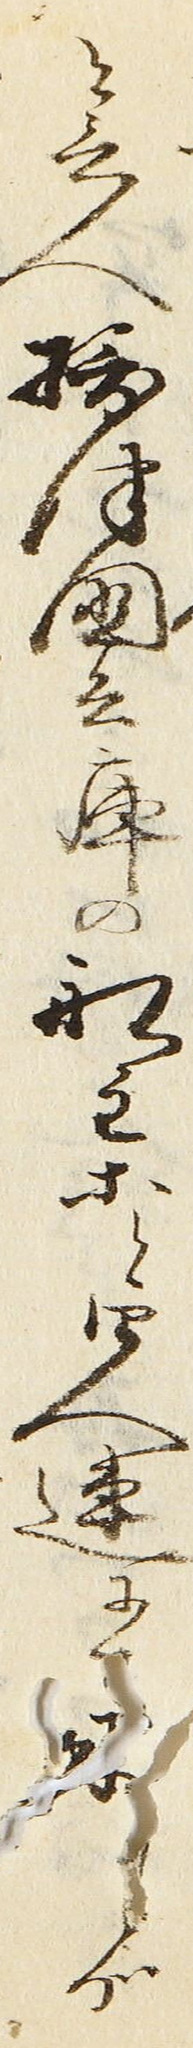と言人摂津国兵庫の船主等と四人連にて来が
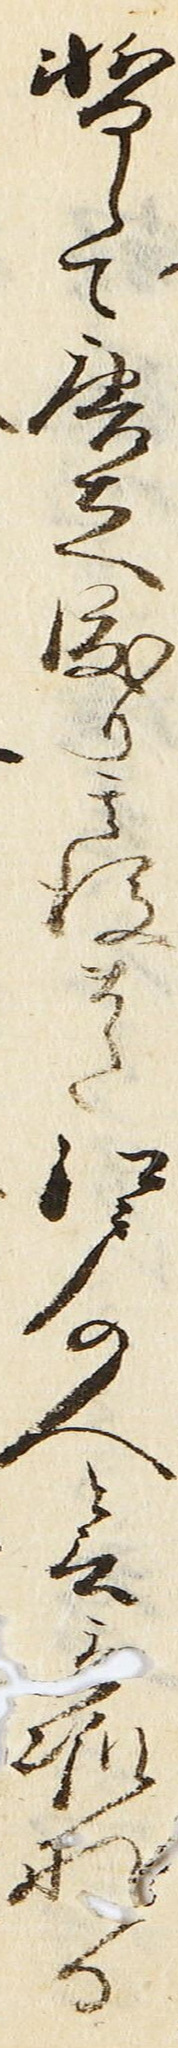暫して唐土へ渡り其後また江戸の人と言立派なる
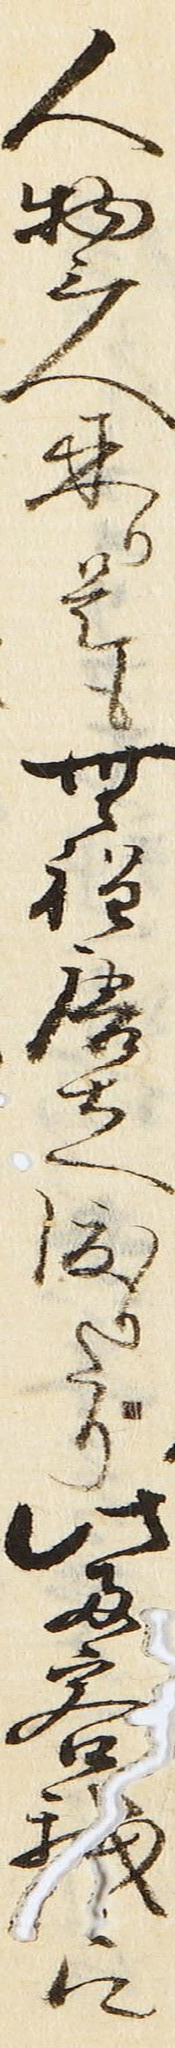人物三人来り是も無程唐土へ渡りたり此両客我々に
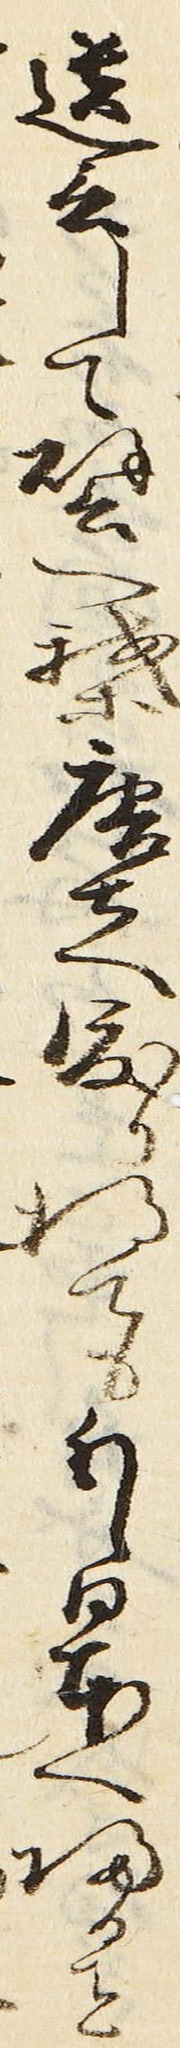遺言して譬へ我等唐土へ渡り得てももし日本へ帰ること
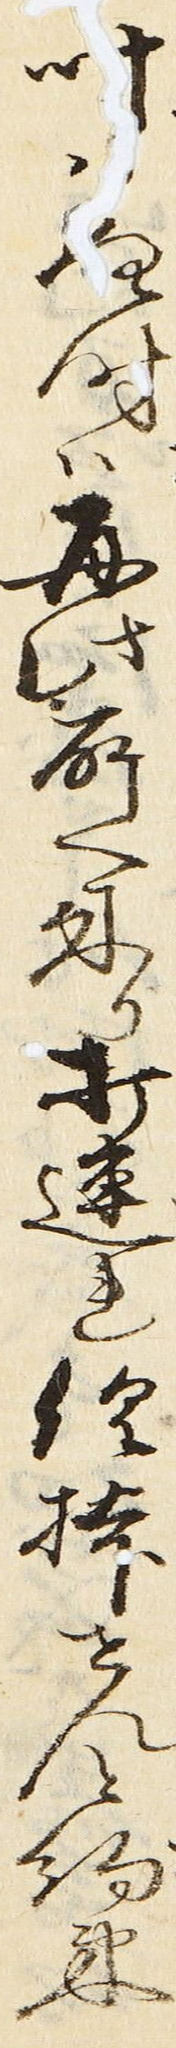叶ハぬ時ハ再此所へ来り打連れ倶挊せんと約束
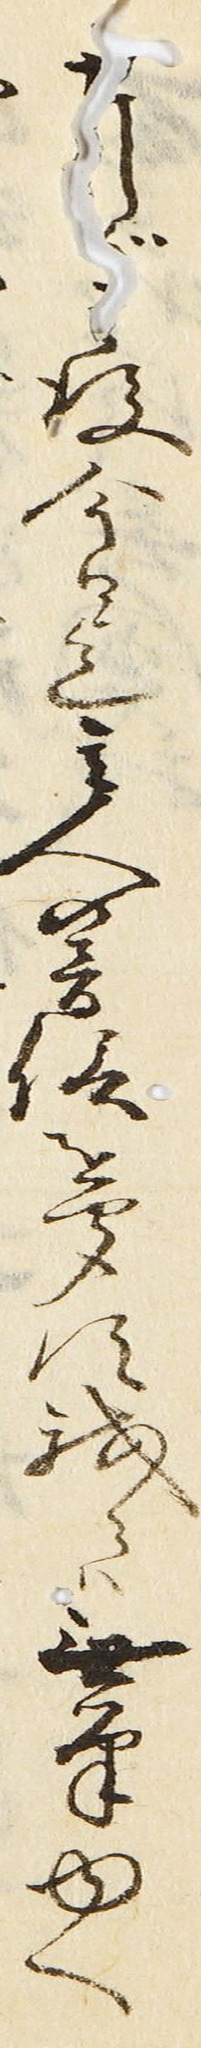せしが其後今日迄其人の音信を聞す我々は無筆ゆへ
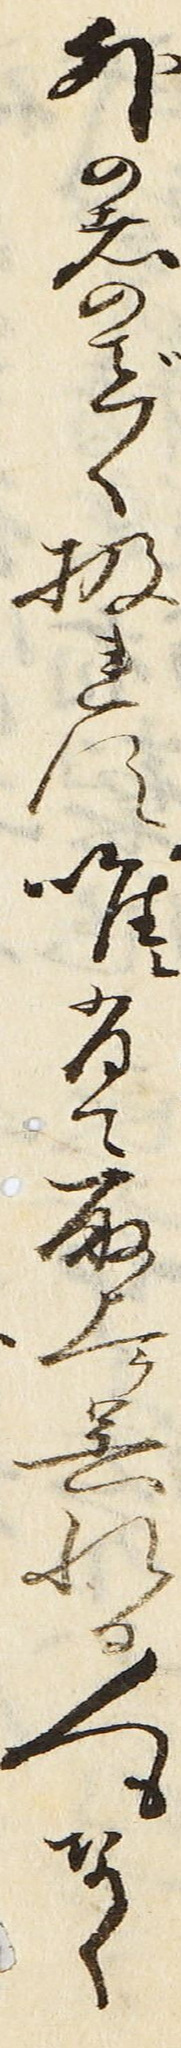外の者のごとく扱れす唯有て取上ケ呉れる人もなく
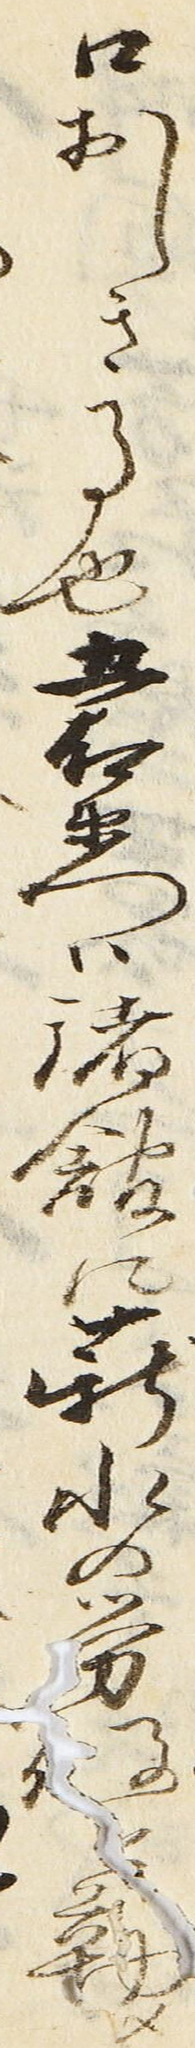口おしき事也五右衛門ハ諸館に薪水の労役勤メ
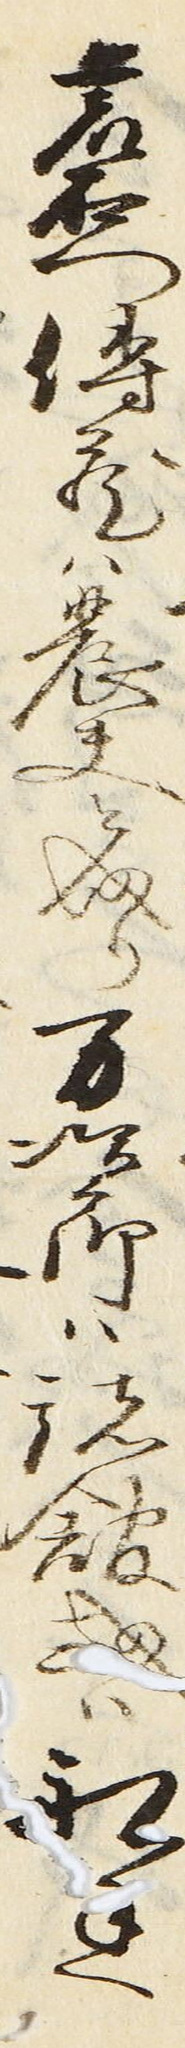虎右衛門伝蔵ハ農夫と成り万次郎ハ諸館或ハ船手へ
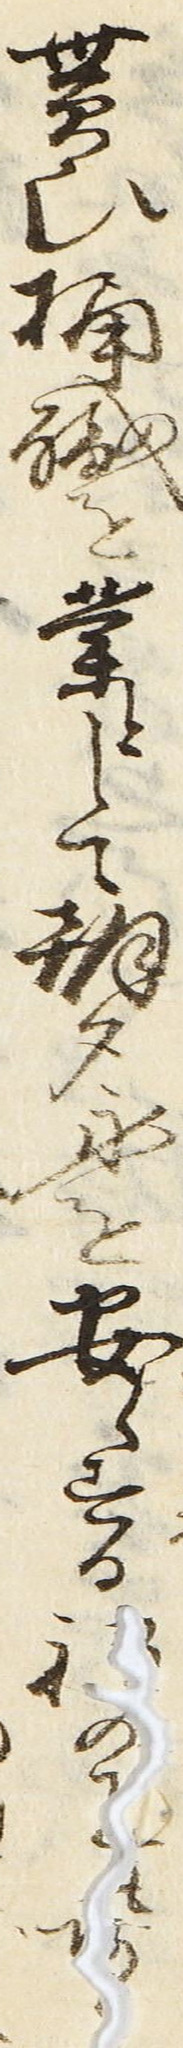貰ひ桶職を業として朝夕身を安くする程のことも
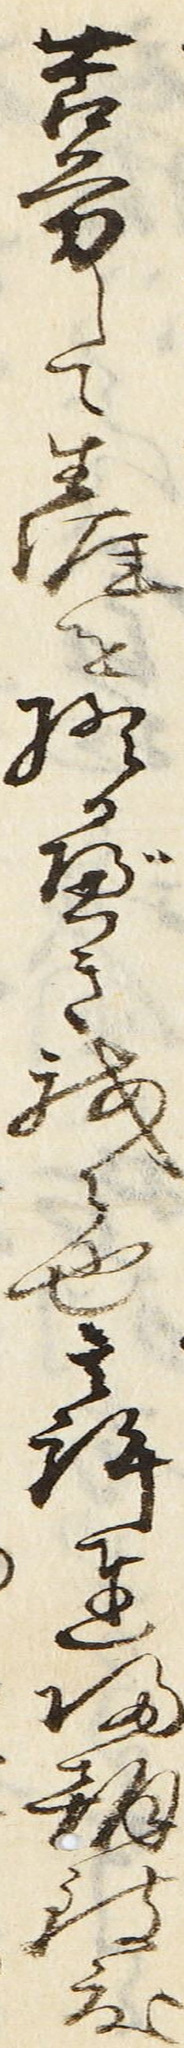苦労して生涯を終るべき我々也其許達帰朝致度
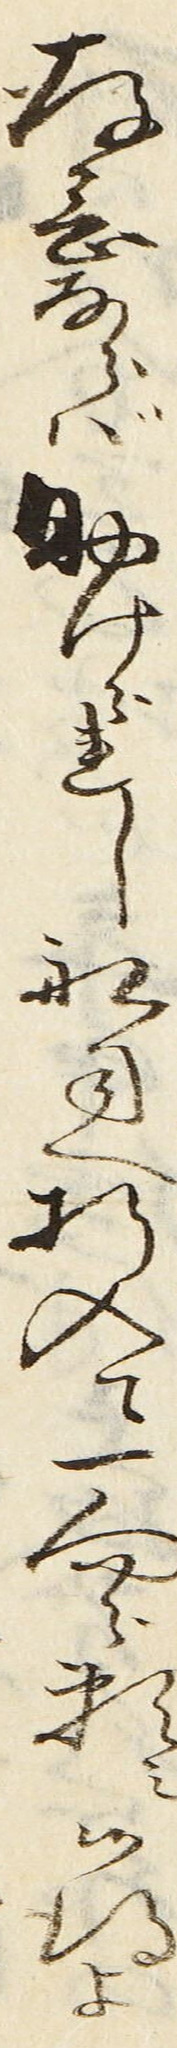存念ならバ助けられし船司へ折入て一向ら頼ミ候得よ
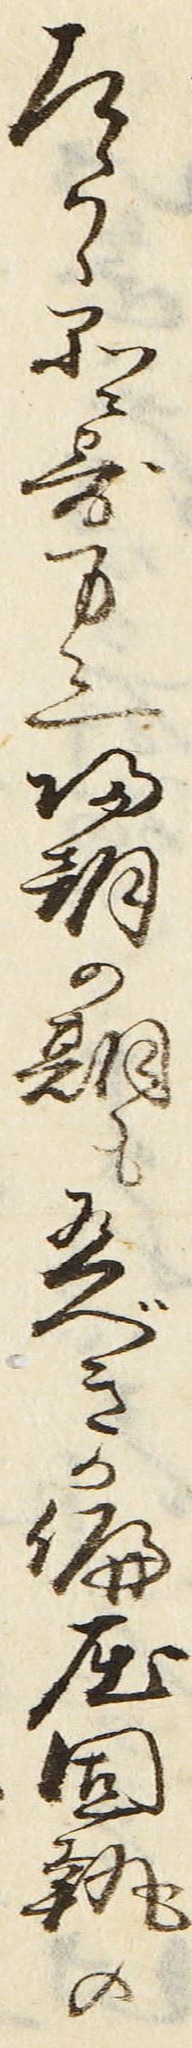左候ハヽ品ニ寄万々一帰朝の期も有べきか偏屈固執の
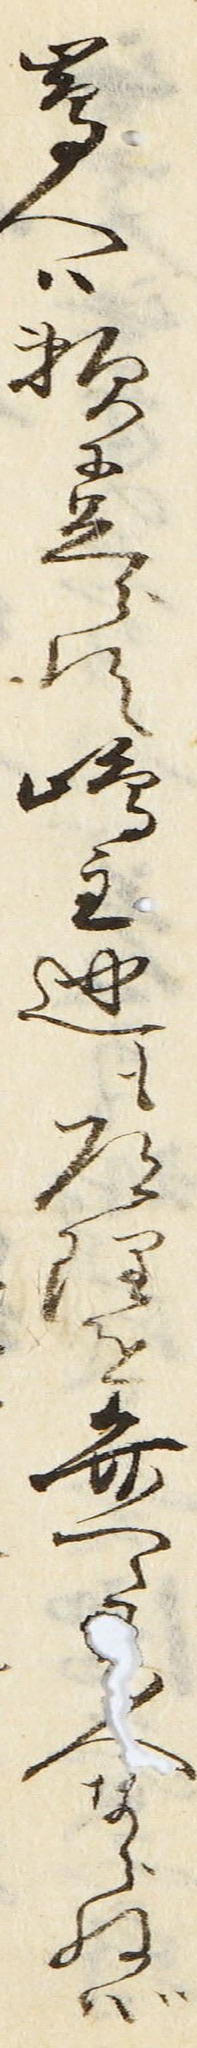島人ハ頼に足らす島主迚も道理を弁へたる人ならねバ
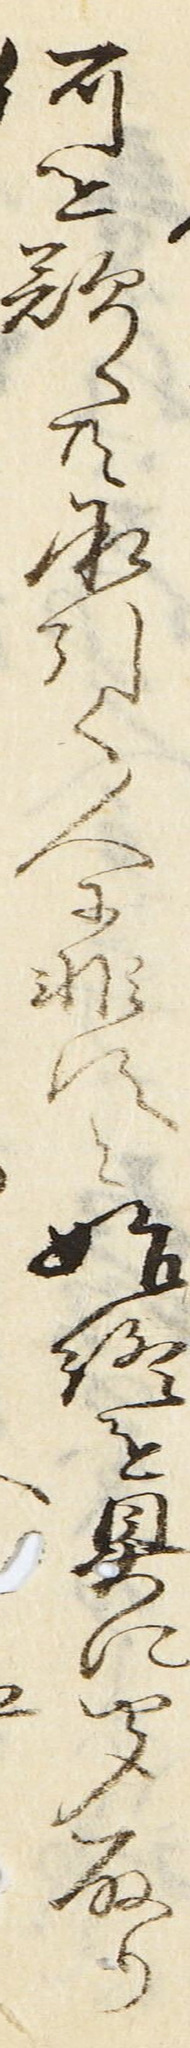何を歎く共承引く人に非すと始終を具に聞取り
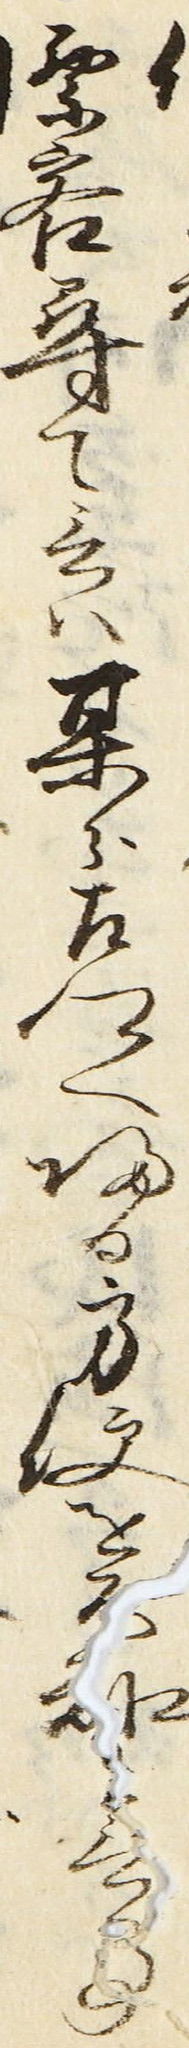漂客尋て言ハ某ら古郷へ帰る方便を不知言事
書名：亜墨利加漂流記聞
